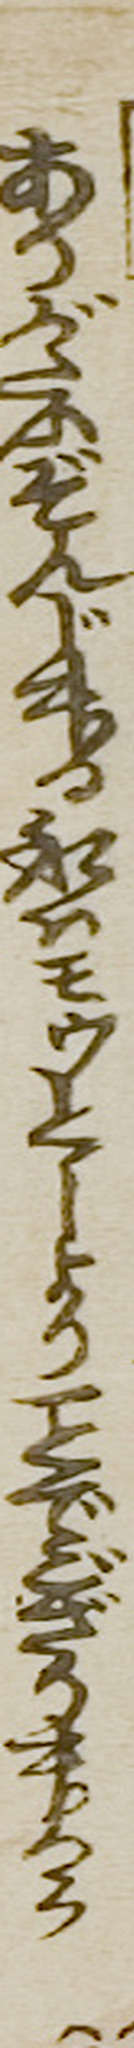ありがたふぞんじ升る私はもうとしよりことでござり升から
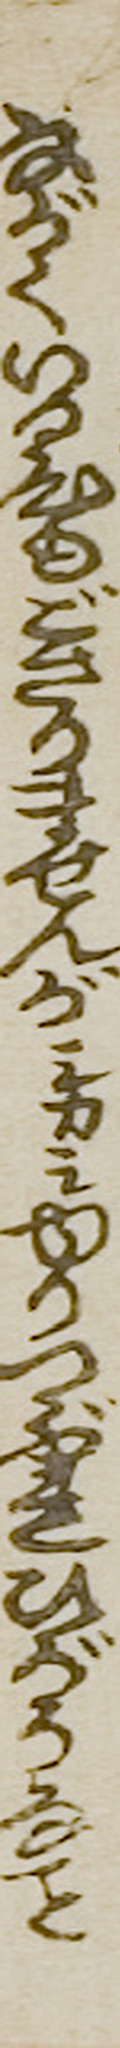ながくいる心もごさりませんがしかしゆりつぶれひがうなこと
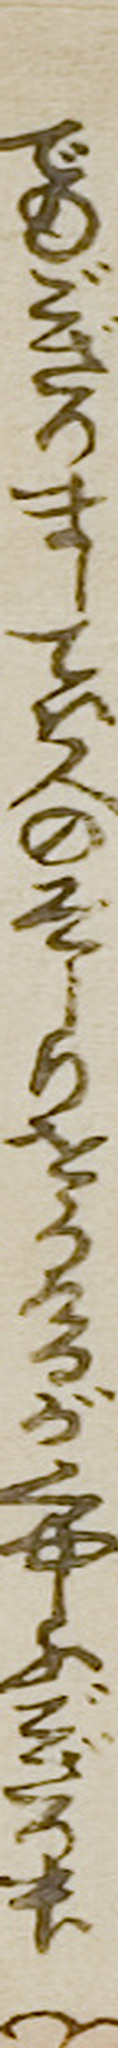でもござりましては人のそしりをうけるがくやしふござり升
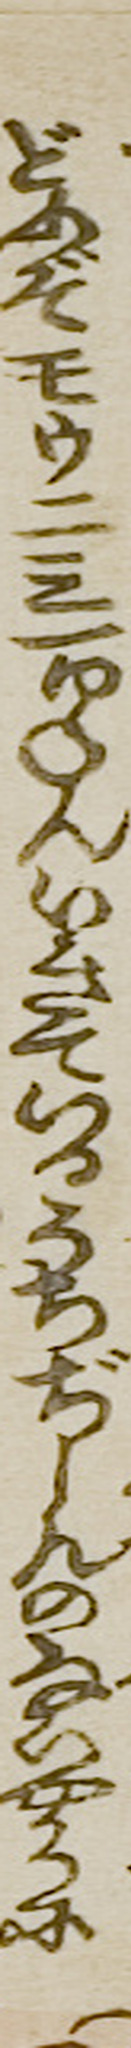どふぞもう二三百ねんいきているうちぢしんのないやうに
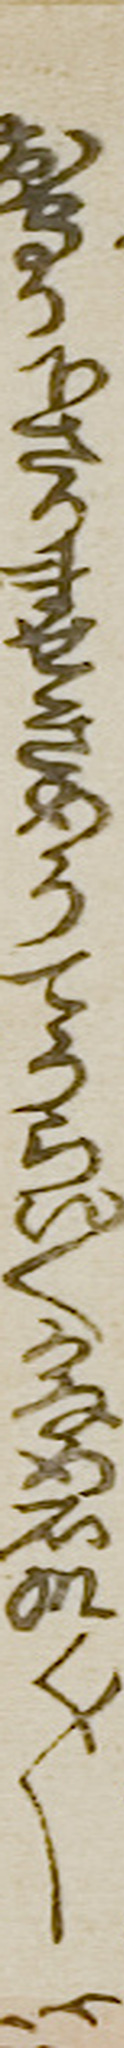お守り下さりませきめうてうらい〳〵かなめ石様〳〵〳〵
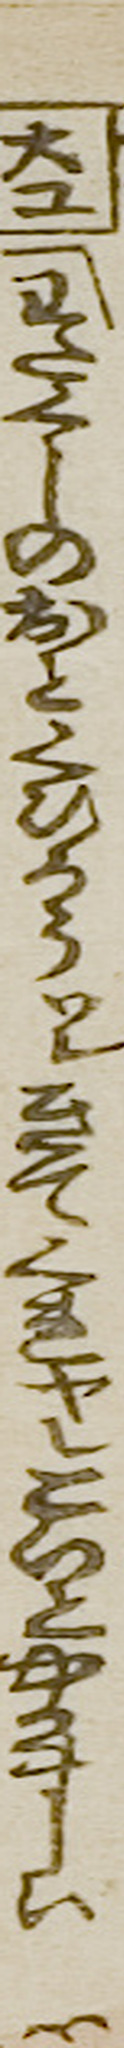大工〽わたくしのおとくひからわれきてくれやれこいとやかましい
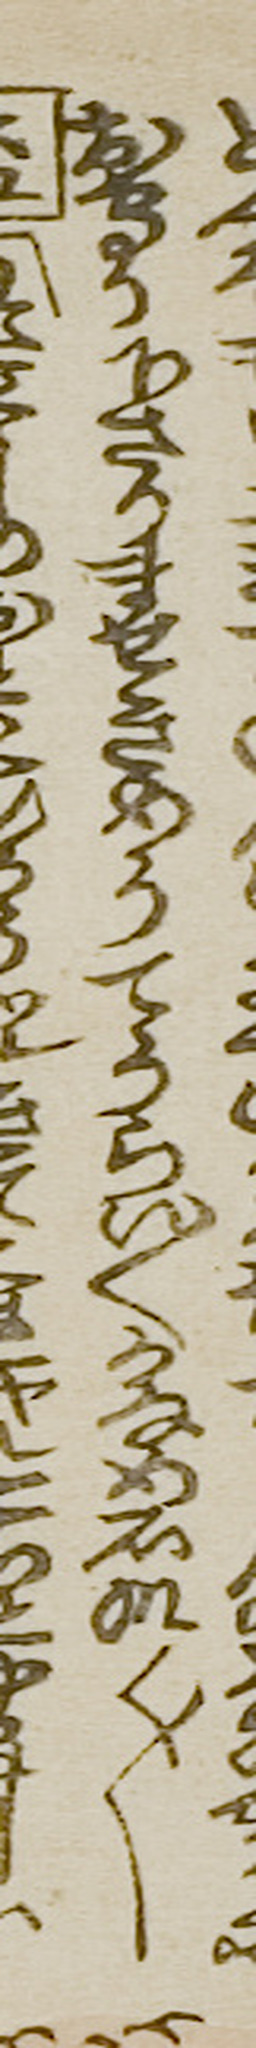大工〽わたくしのおとくひからわれきてくれやれこいとやかましい
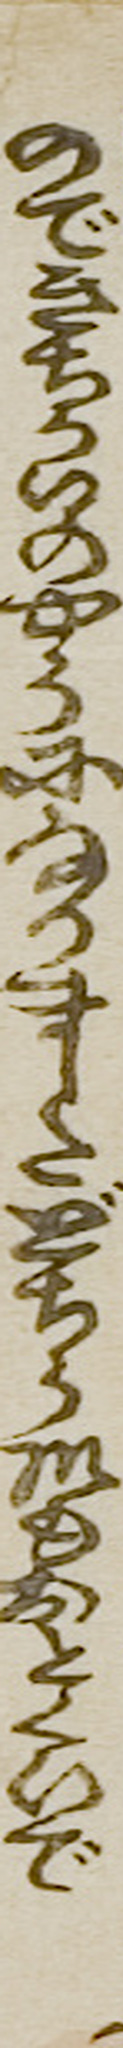のできちかいのやうになりましたどちら様もおとくいで
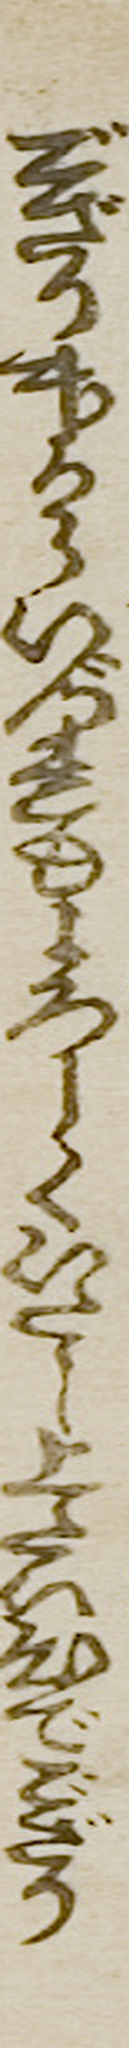ござり升からいづれもよろしくいたし上たい心でござり
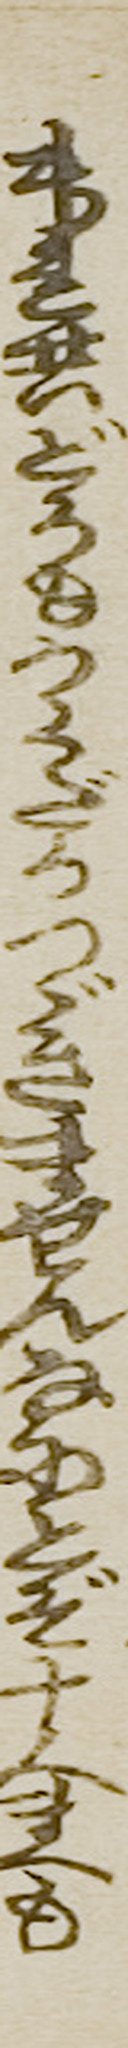升れ共どうもからだかつゞきませんなにとぞ十人まへも
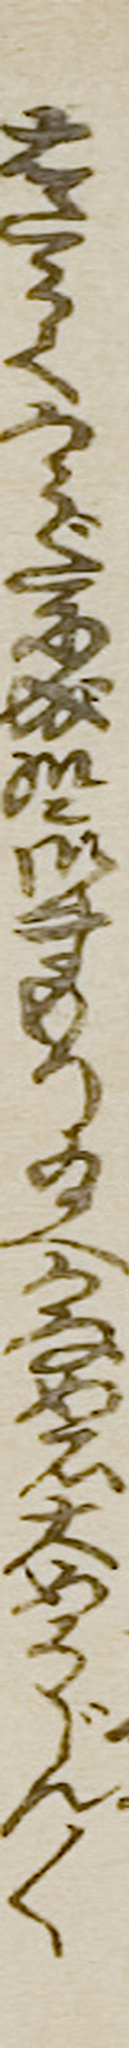はたらくからだに成様に御まもり給へかなめ石大めうじん〳〵
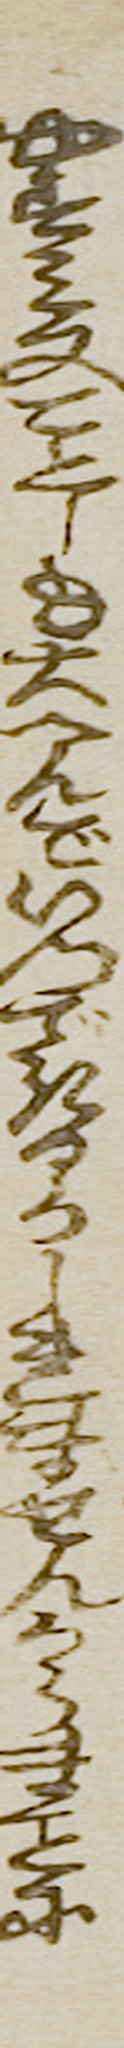やすみ又ことしも大へんでいつできるかしれませんからまことに
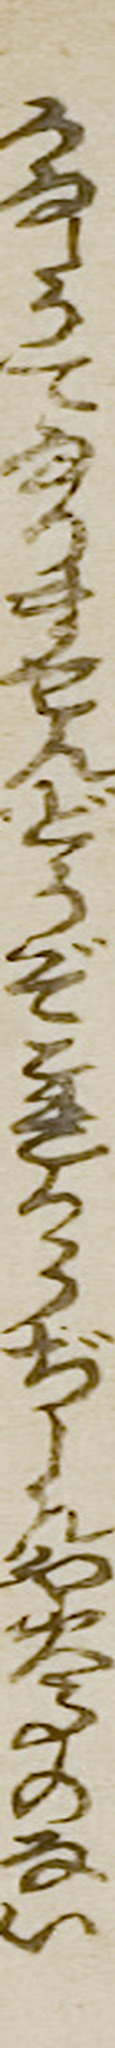かなしうてなりませんどうぞこれからぢしんや火事のない
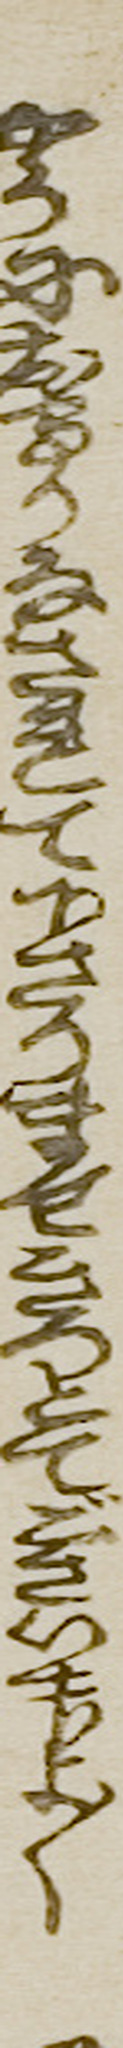やうにお守りなされて下さりませきつとてごさい升よ〳〵
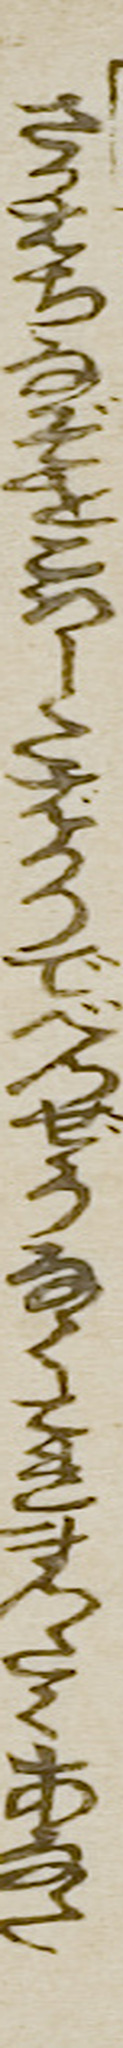さらはちなぞをこはしたばかりでべつぜうなくこれまつたくあなた
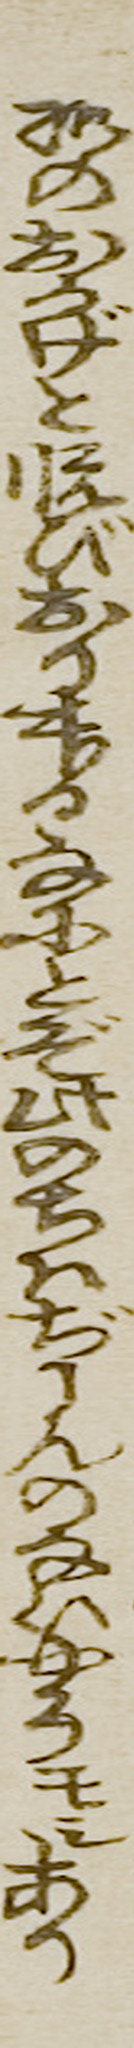様のおかげと悦びおり升るなにとぞ此のちはぢしんのないやうもしあり
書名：あんしん要石
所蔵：東京大学総合図書館 General Library in the University of Tokyo, JAPAN
